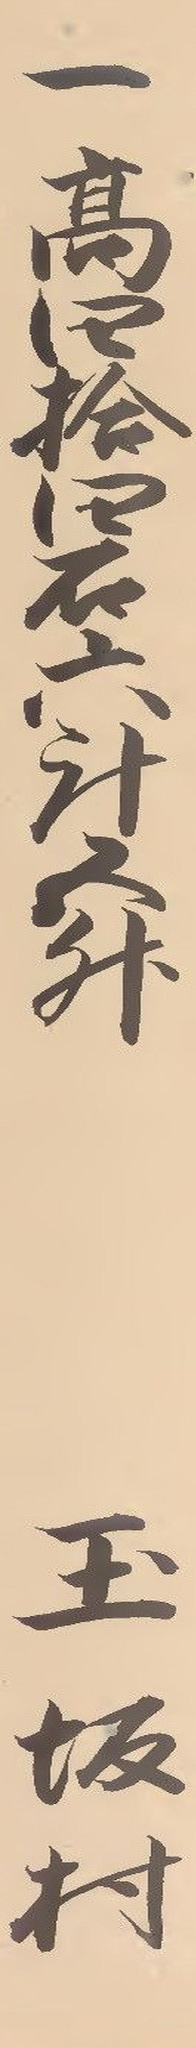一高四拾四石六斗五升玉坂村
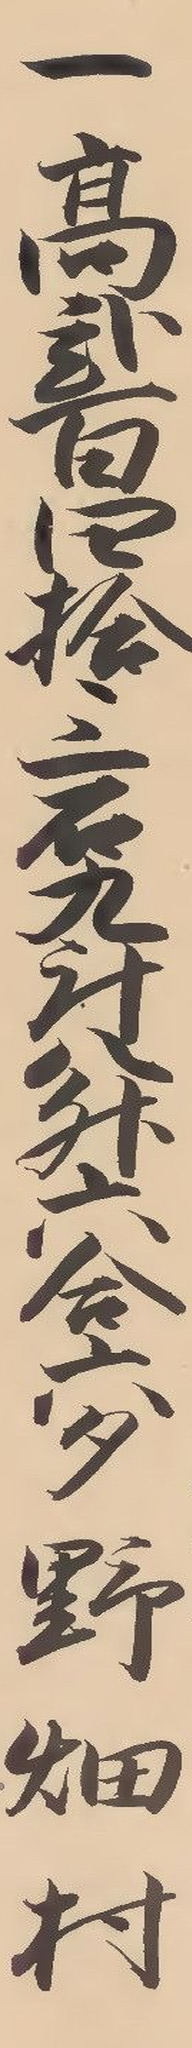一高弐百四拾三石九斗八升六合六勺野畑村
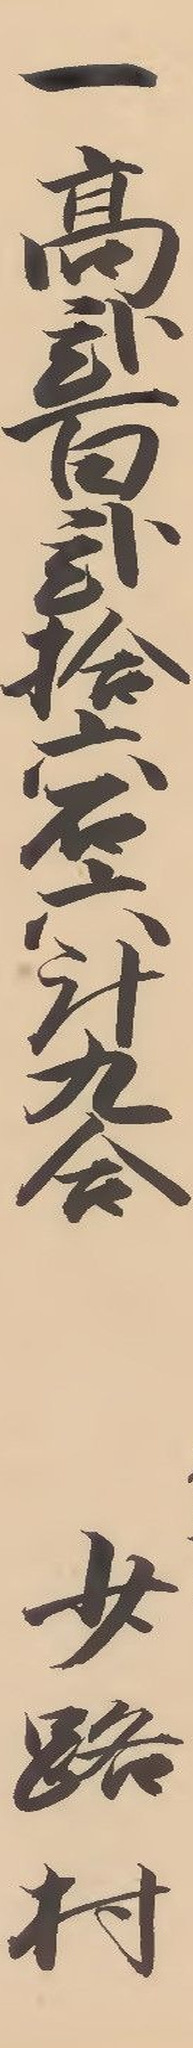一高弐百弐拾六石六斗九合少路村
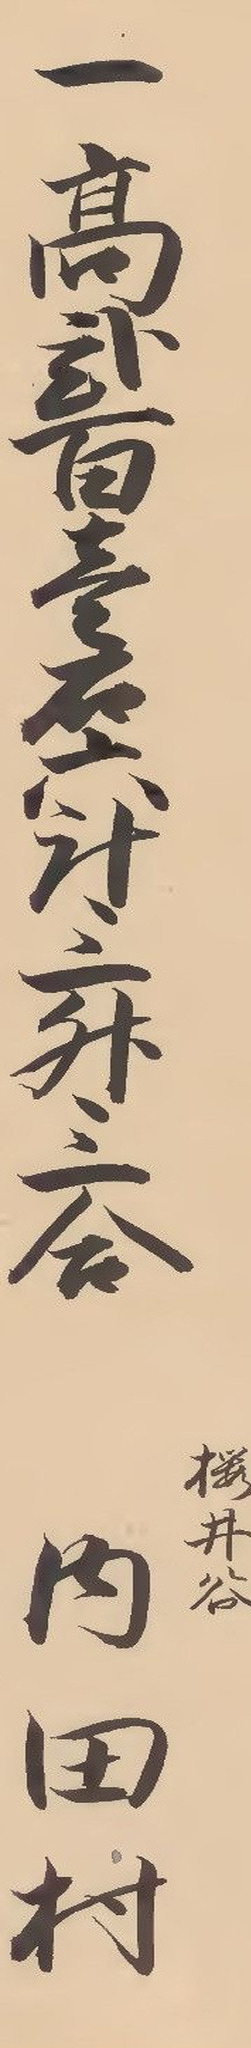一高弐百壱石六斗三升三合内田村

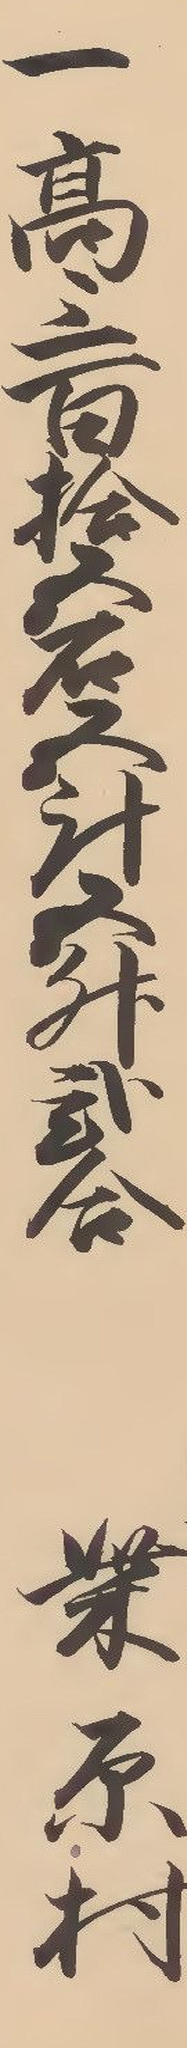一高三百拾五石五斗五升弐合業原村
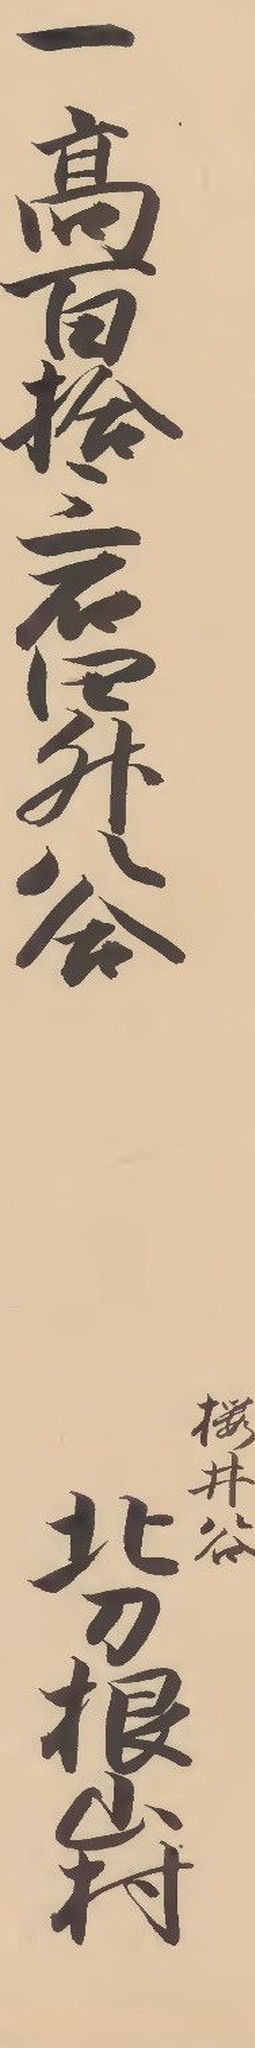一高百拾三石四升八合北刀根山村
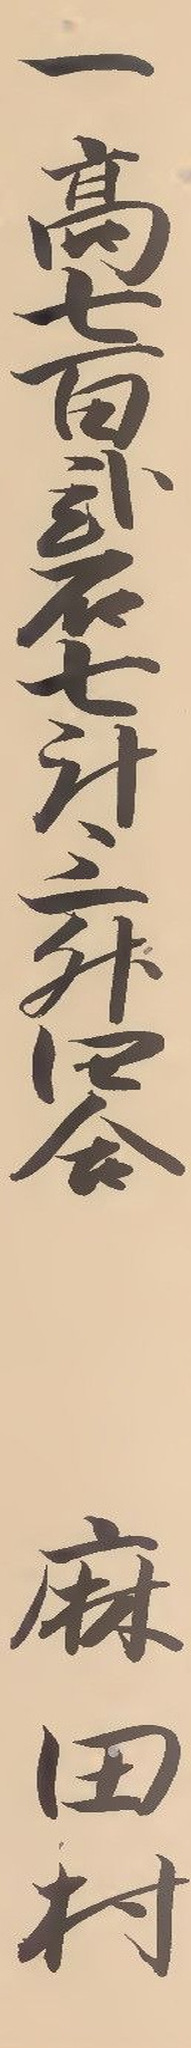一高七百弐石七斗三升四合麻田村
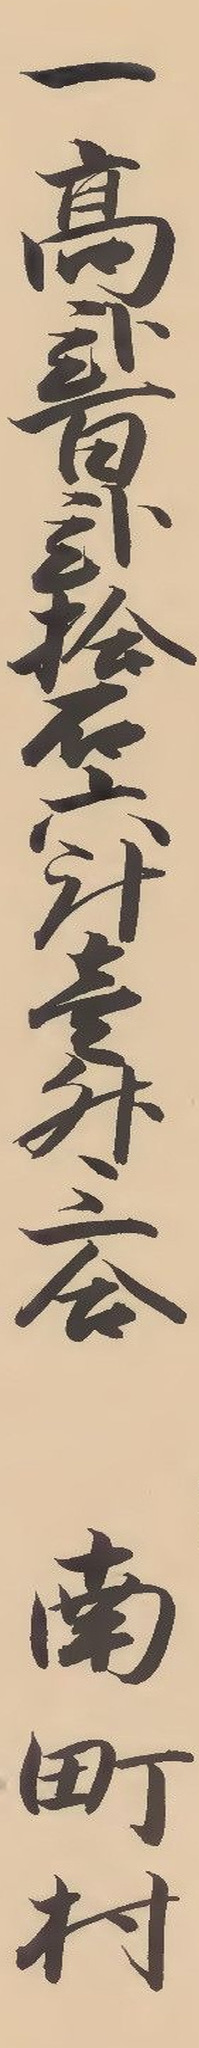一高弐百弐拾石六斗壱升三合南町村
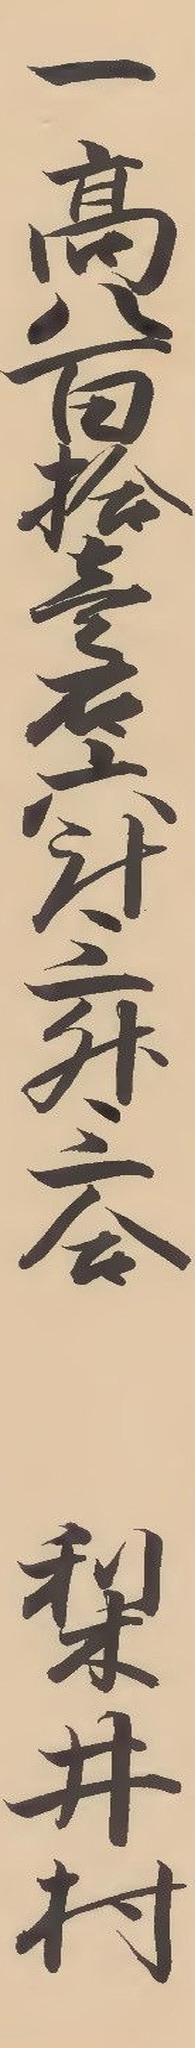一高八百拾壱石六斗三升三合梨井村
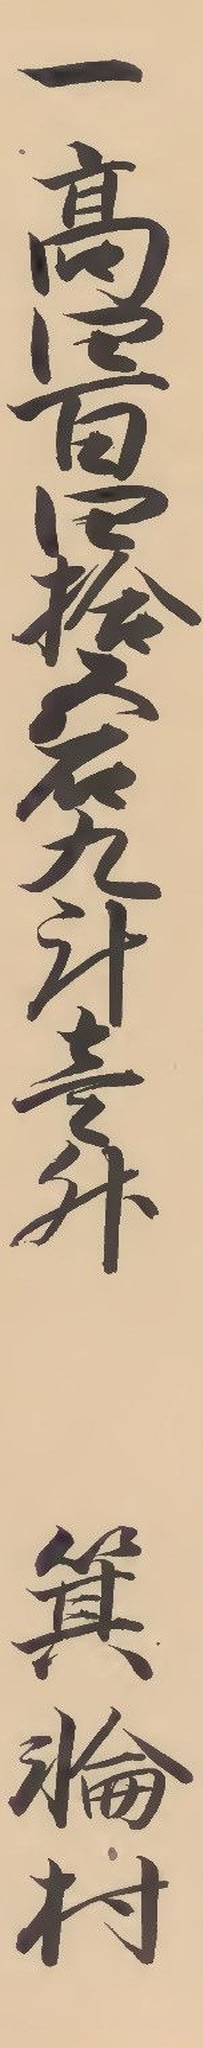一高四百四拾五石九斗壱升箕輪村

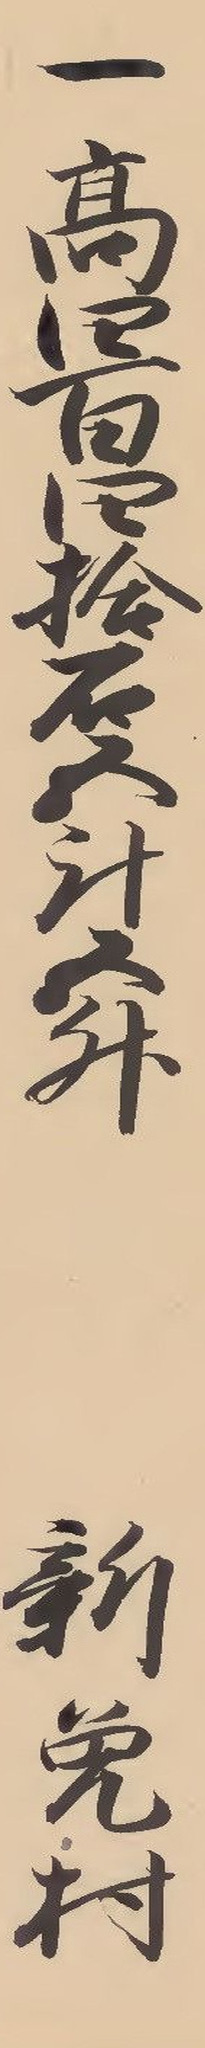一高四百四拾石五斗五升新免村
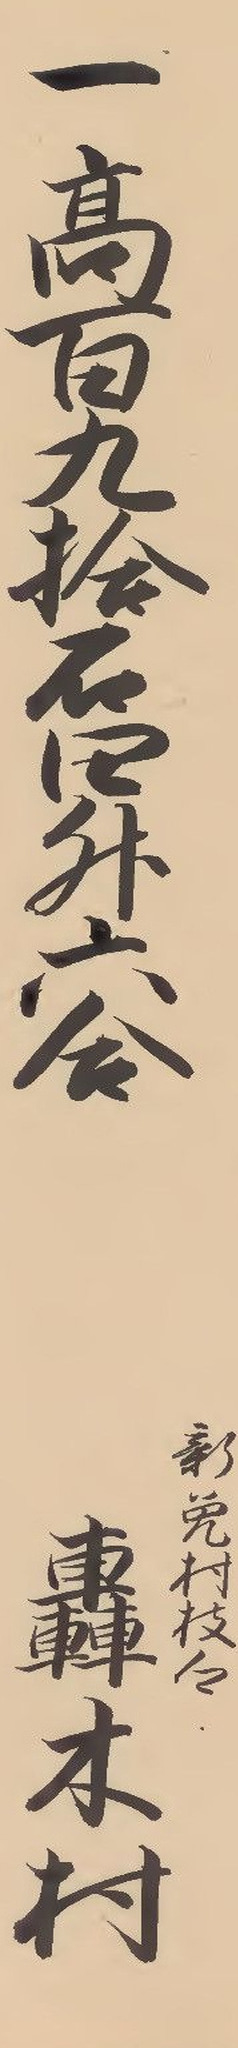一高百九拾石四升六合轟木村
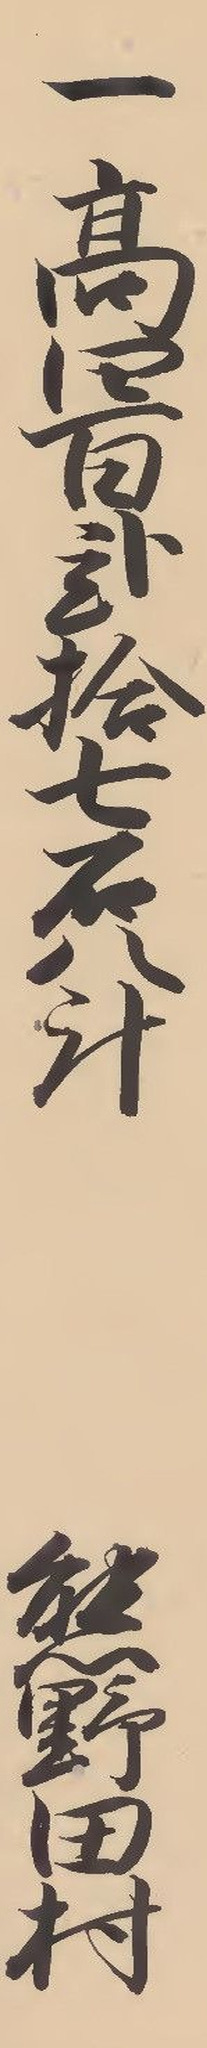一高四百弐拾七石八斗熊野田村
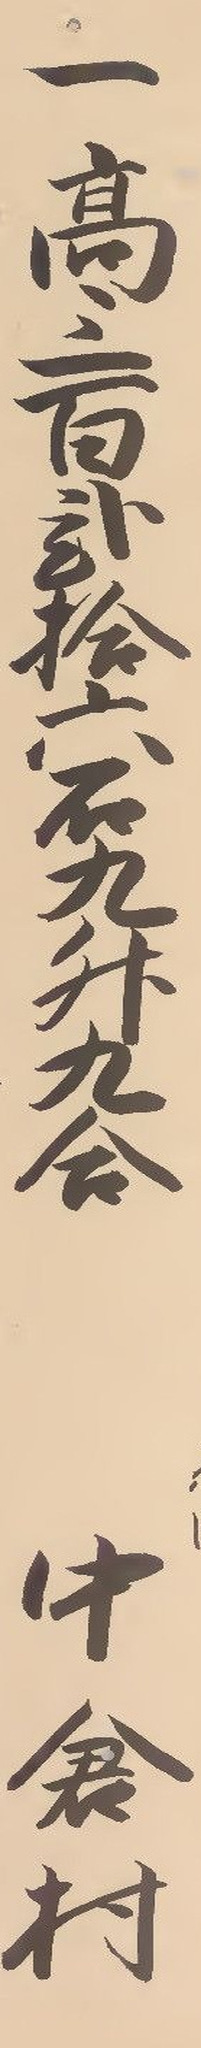一高三百弐拾六石九升九合中倉村
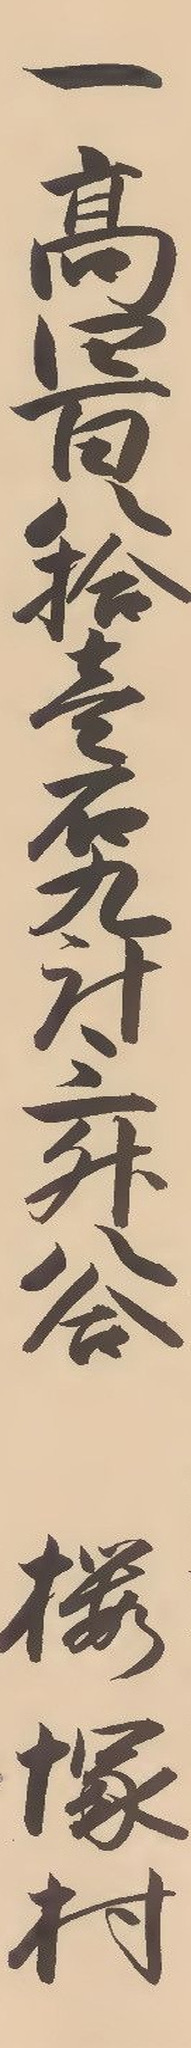一高四百八拾壱石九斗三升八合桜塚村
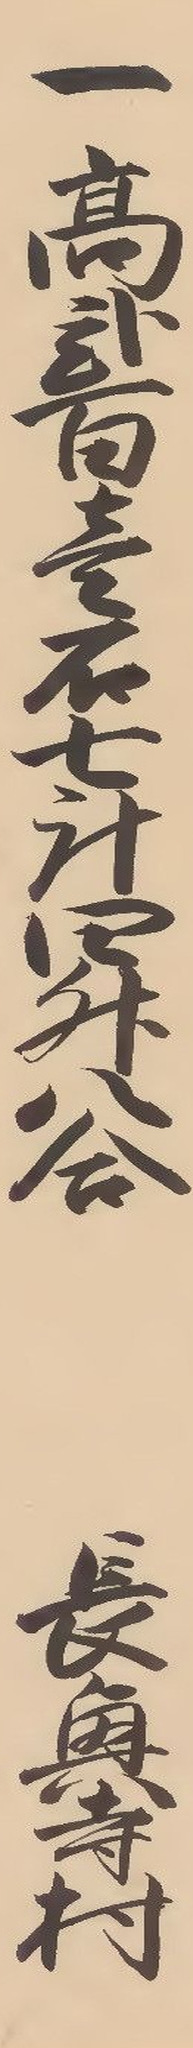一高弐百壱石七斗四升八合長興寺村
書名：摂津国郷帳
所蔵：国立公文書館 National Archives of Japan
